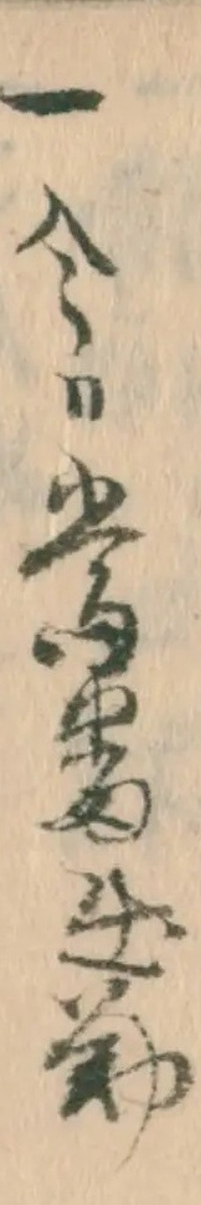一今日当番出勤
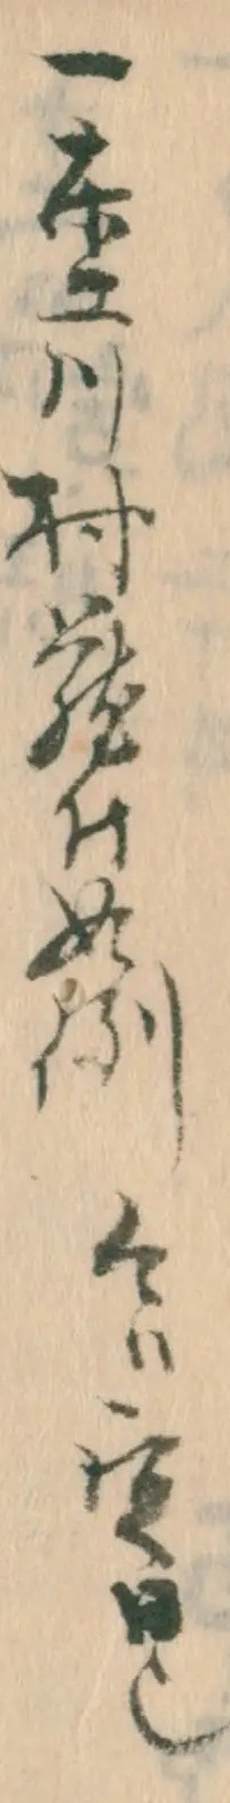一東土川村蔵付如例今日定日也
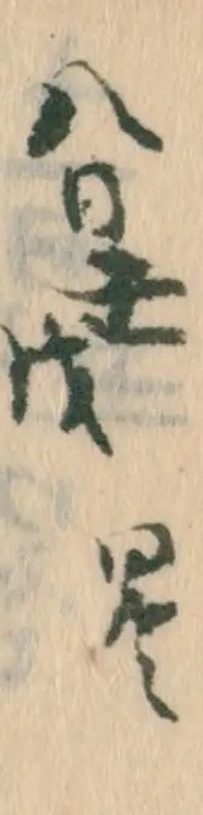八日壬戌曇
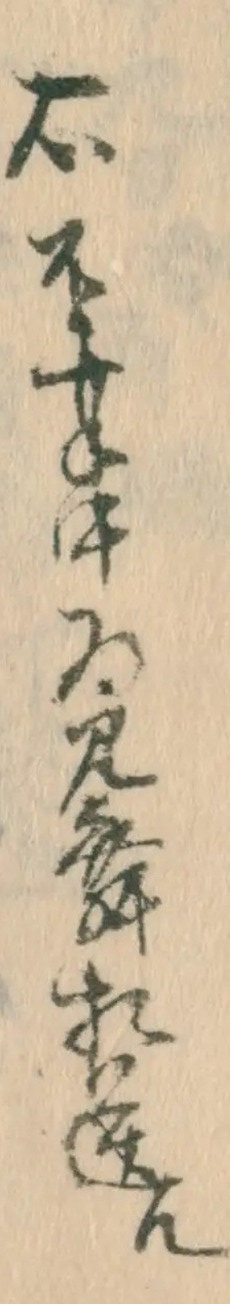右不幸中為見舞相送ル
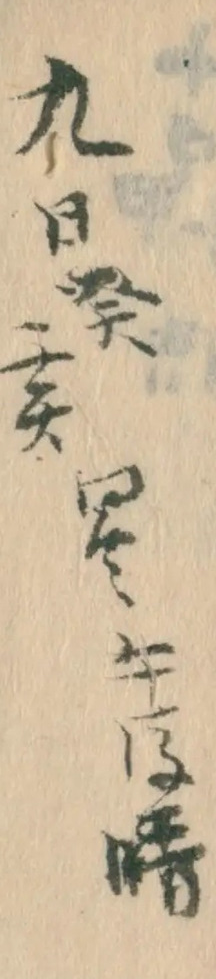九日癸亥曇午後晴

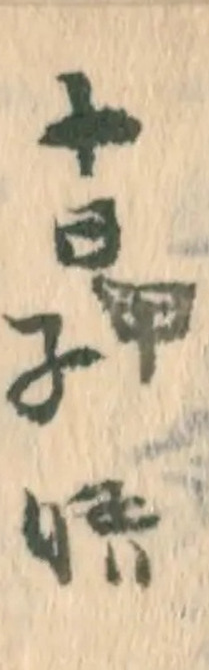十日甲子晴
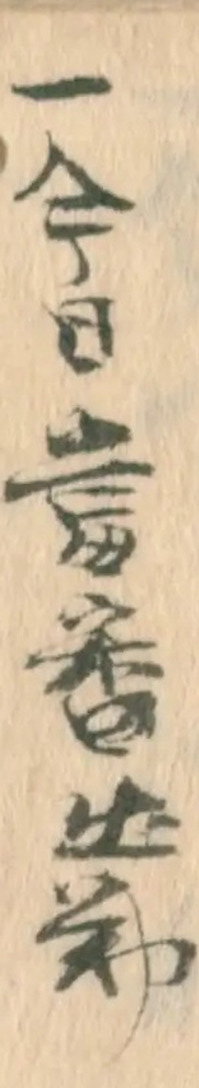一今日当番出勤
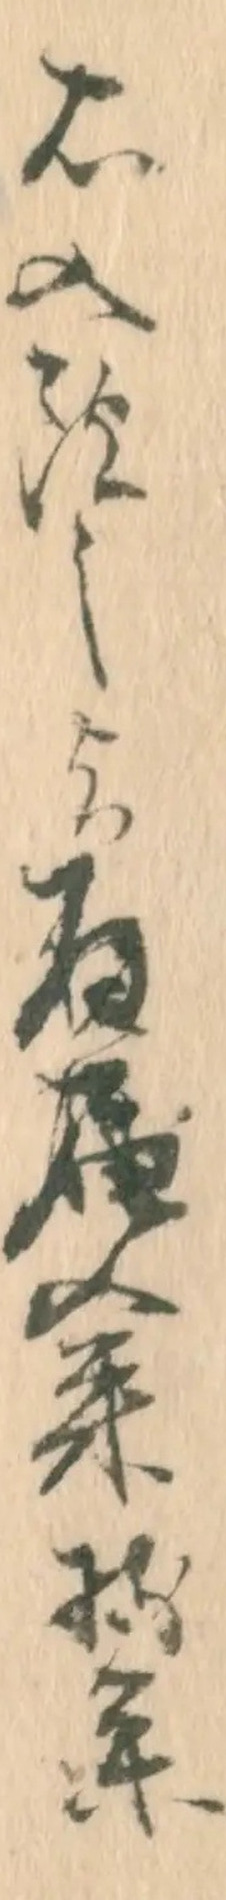右入院之旨為届入来持参
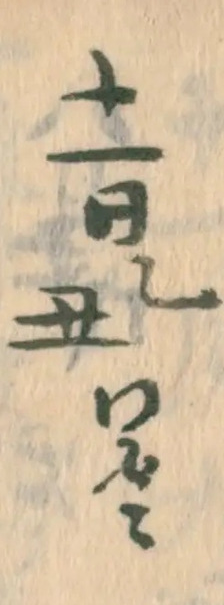十一日乙丑曇
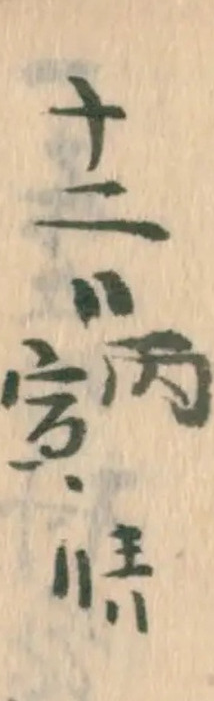十二日丙寅晴
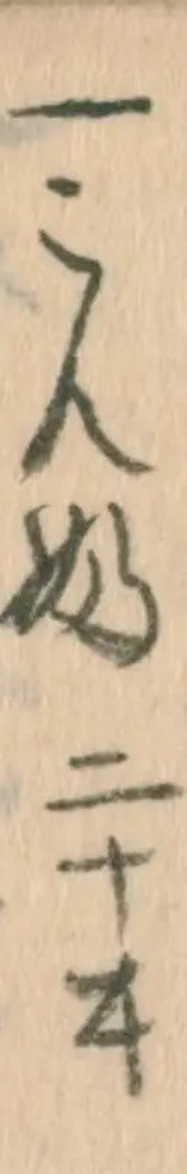一こん婦二十本
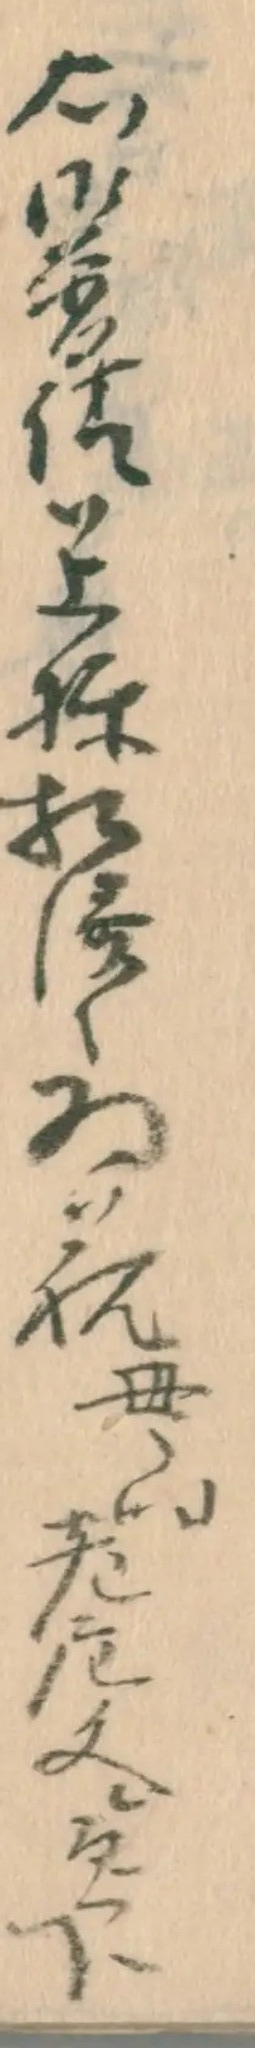右御普請御上棟相済候為御祝母へ向老尼文ニ而被下
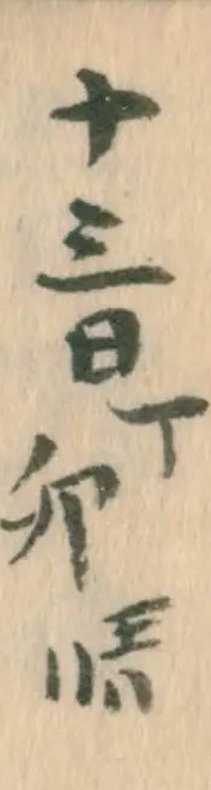十三日丁卯晴
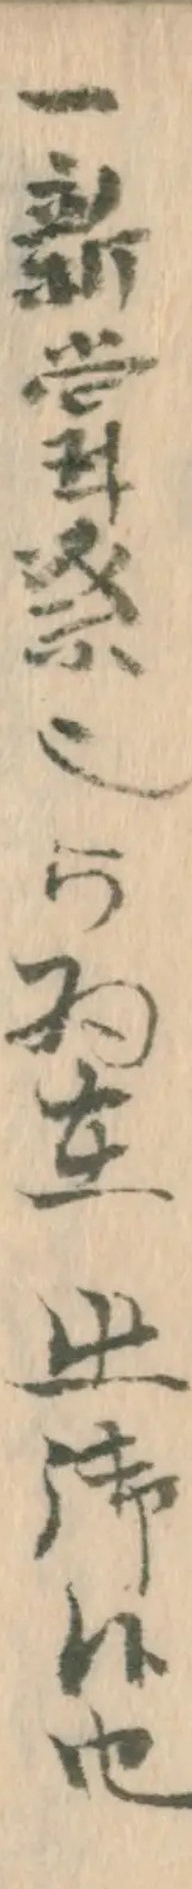一新嘗祭也被為在出御候也
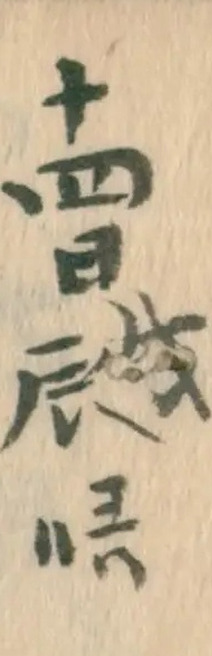十四日戊辰晴
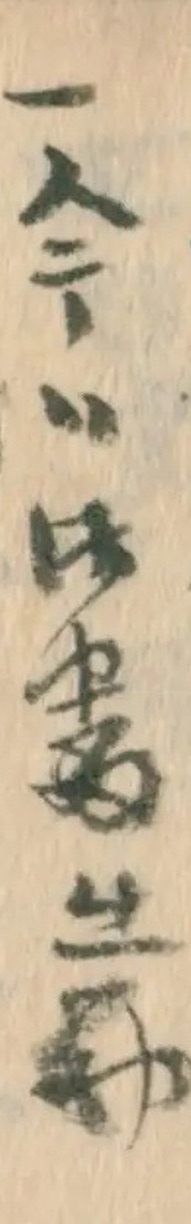一今日御番出勤
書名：禁裏御所御用日記. [131]
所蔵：国立国会図書館 National Diet Library, JAPAN
